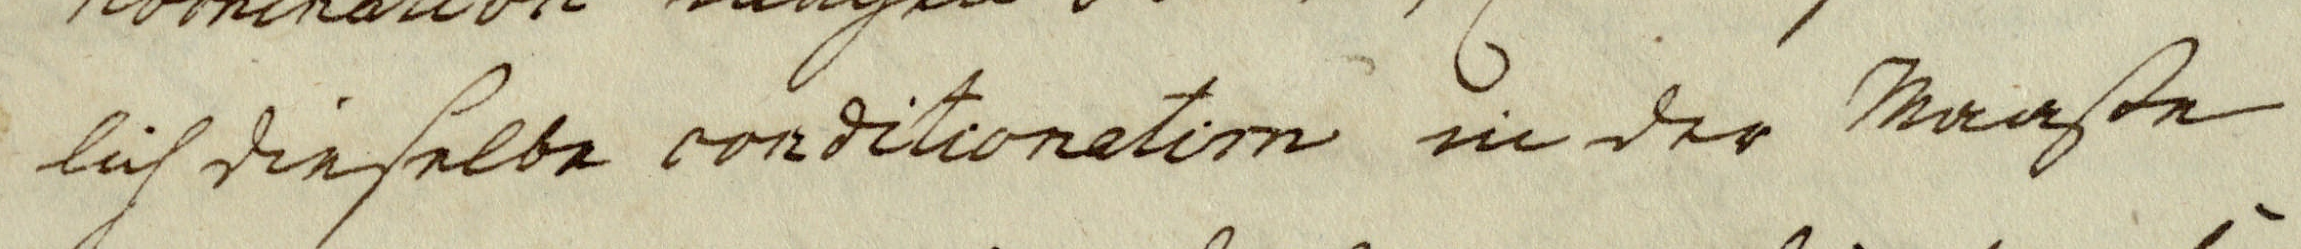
lich dieselbe conditionatim in den Maaße
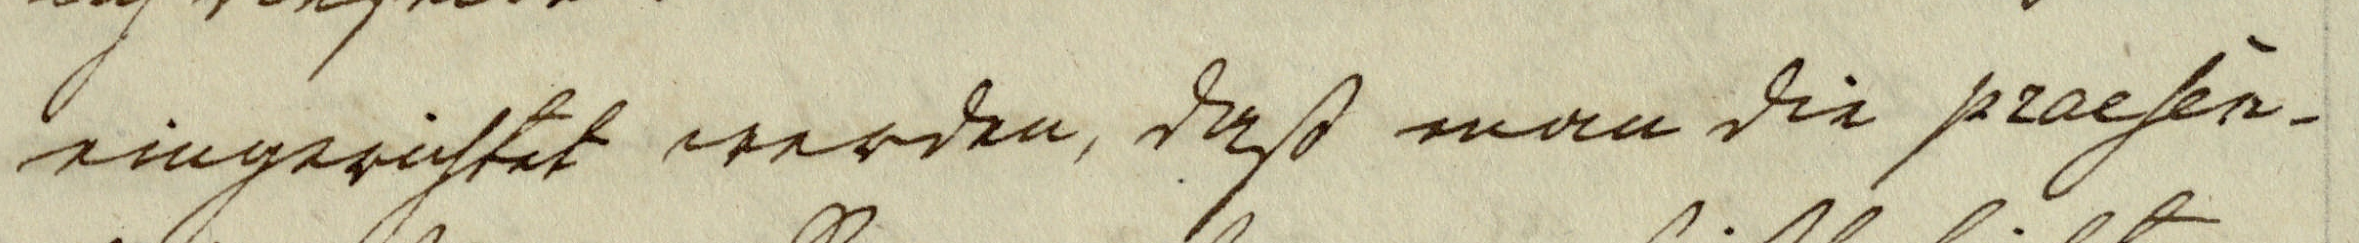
eingerichtet werden, daß man die praesen¬
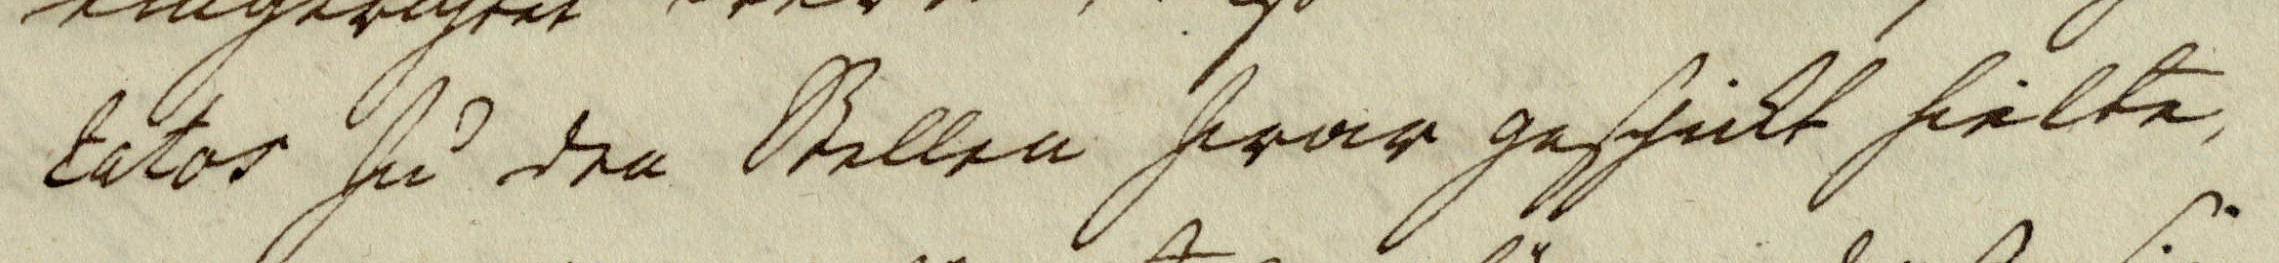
tatos zu den Stellen zuvor geschickt hielte,
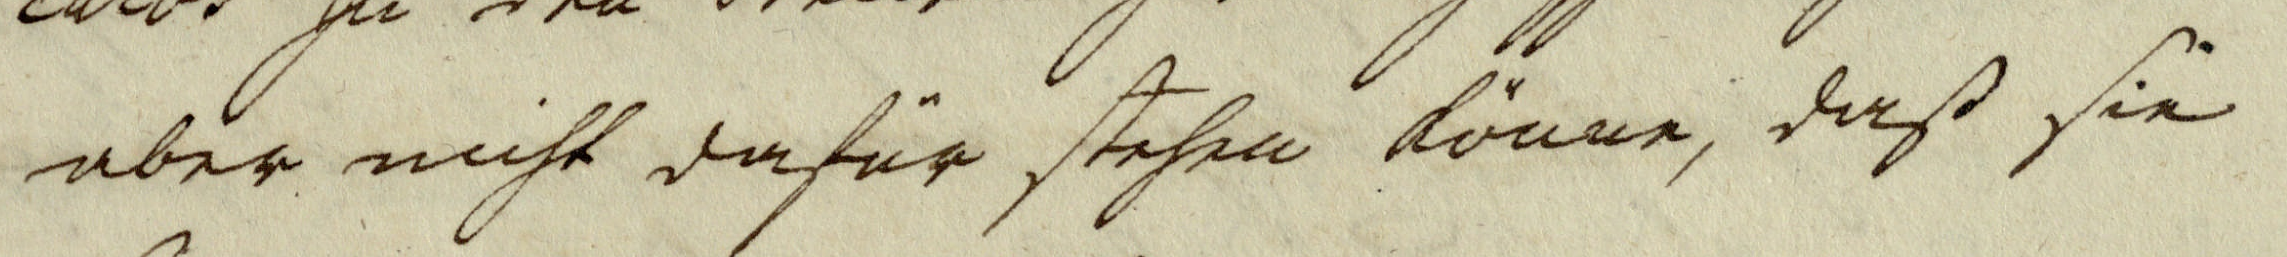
aber nicht dafür stehen können, daß sie
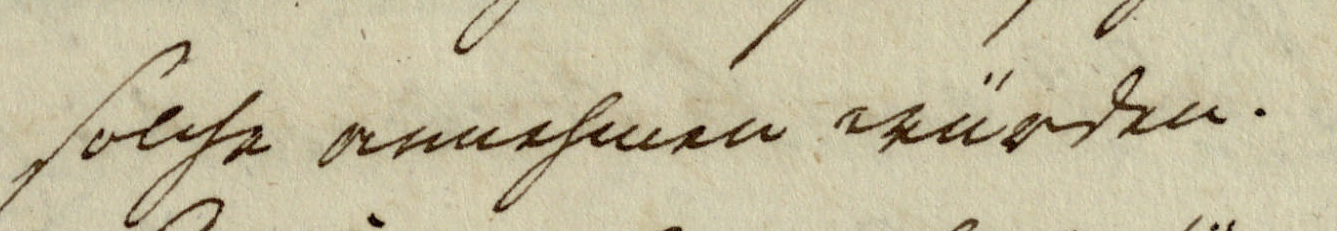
solche annehmen würden.
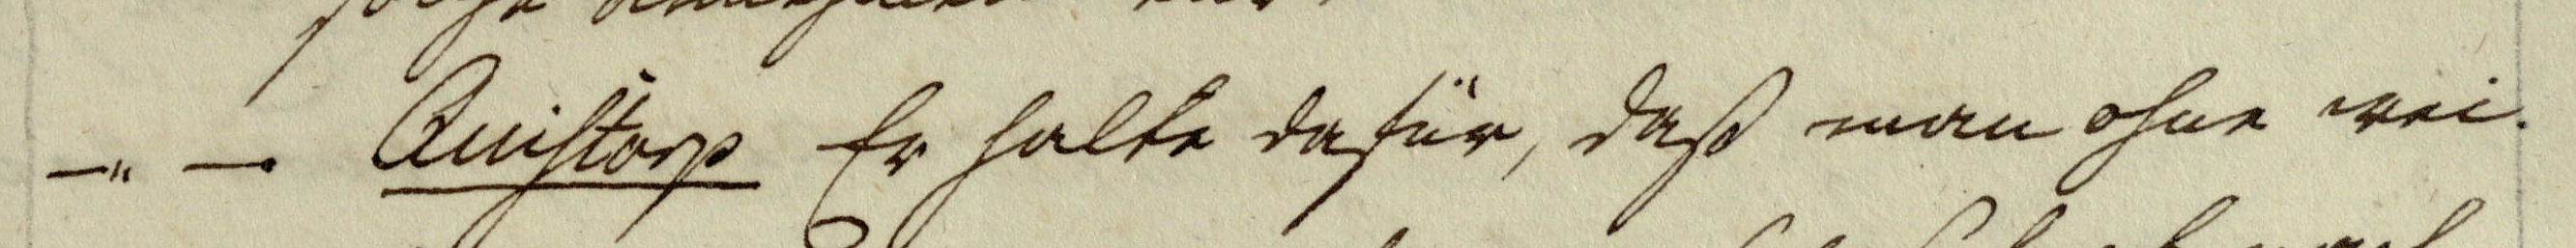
— " — . Quistorp Er halte dafür, daß man ohne wei¬
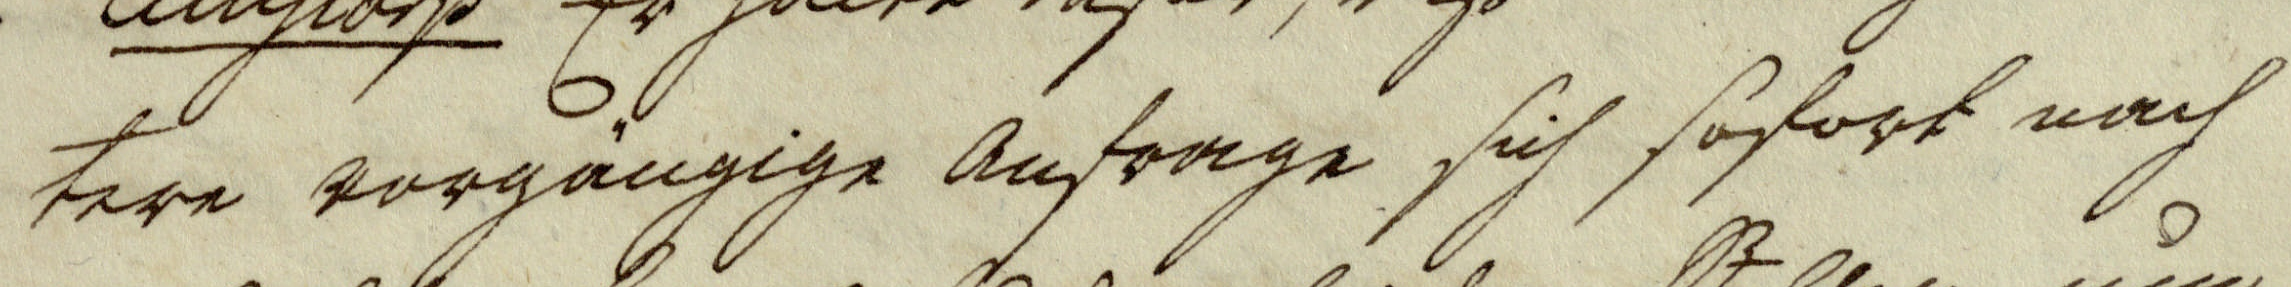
tere vorgängige Anfrage sich sofort nach
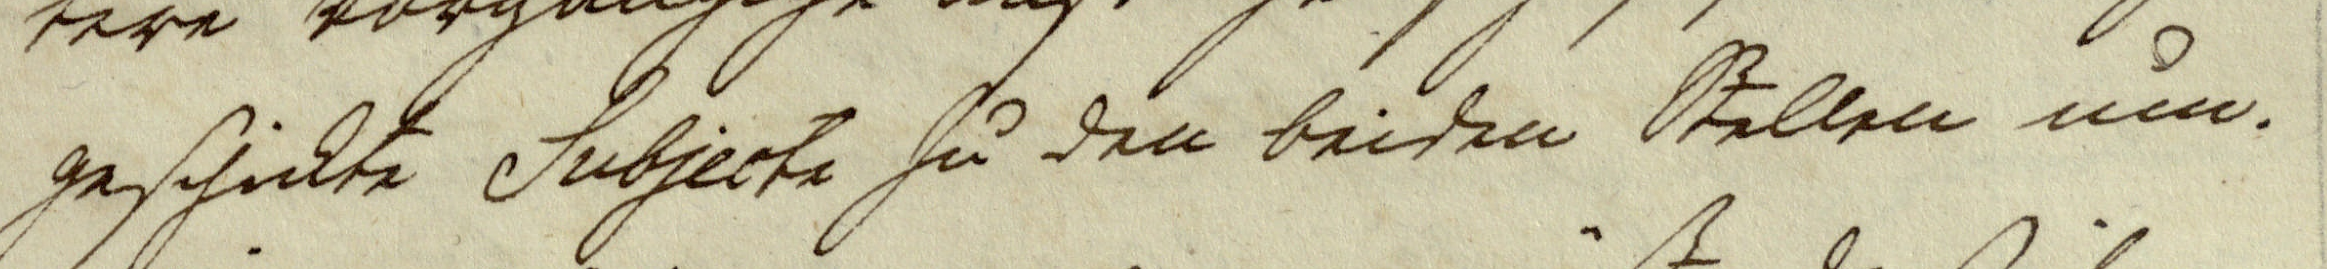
geschickte Subjecte zu den beiden Stellen um¬
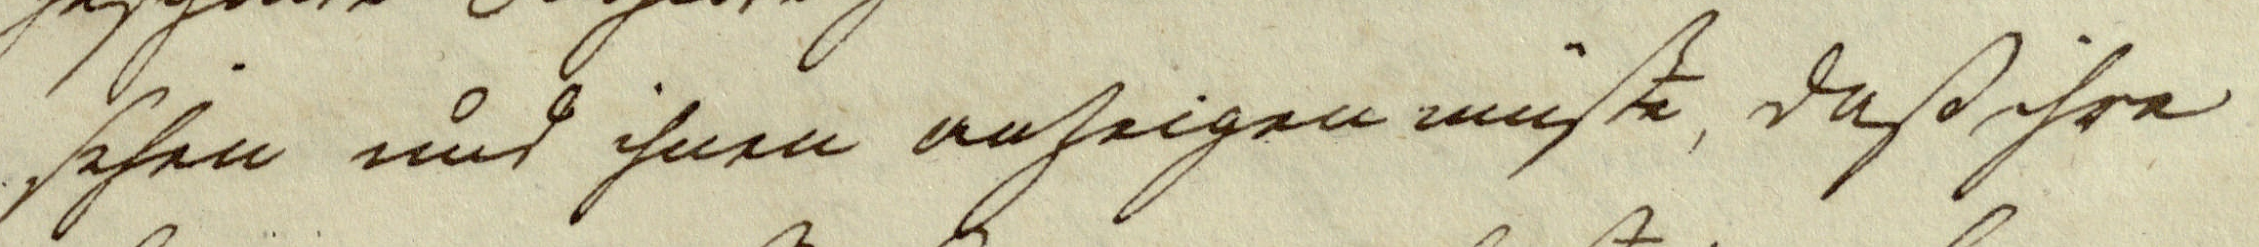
sehen und ihnen anzeigen müßte, daß ihre
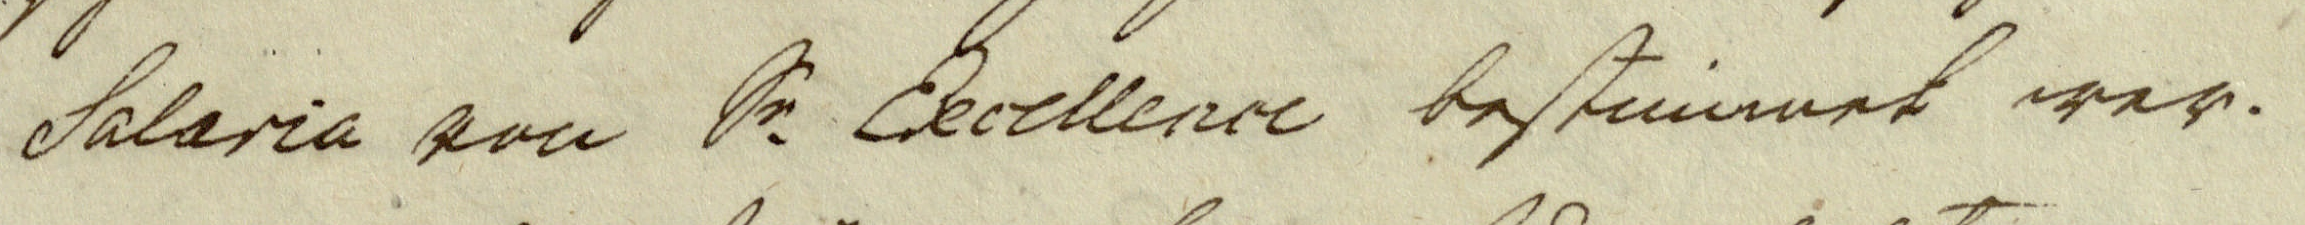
Salaria von Sr. Excellence bestimmt wer¬
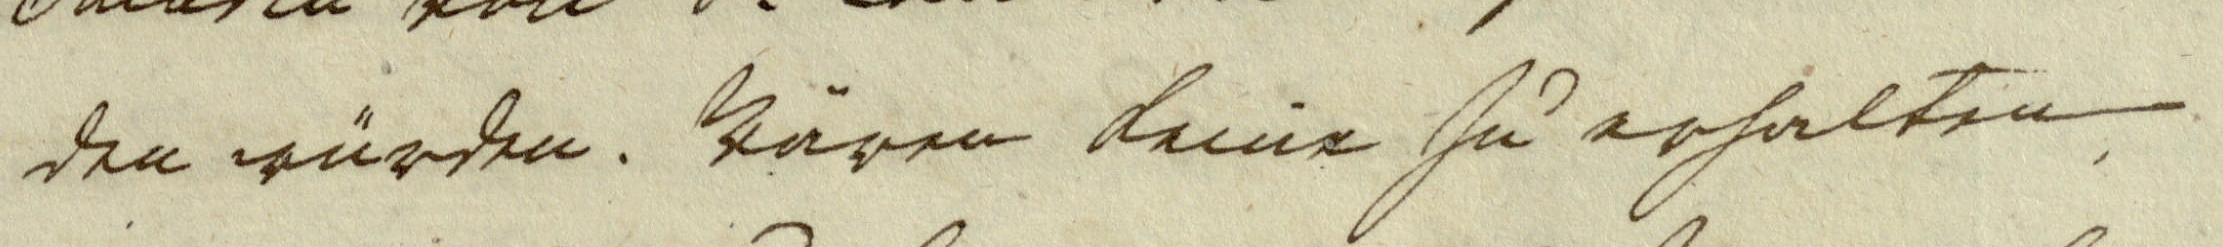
den würden. Wären keine zu erhalten
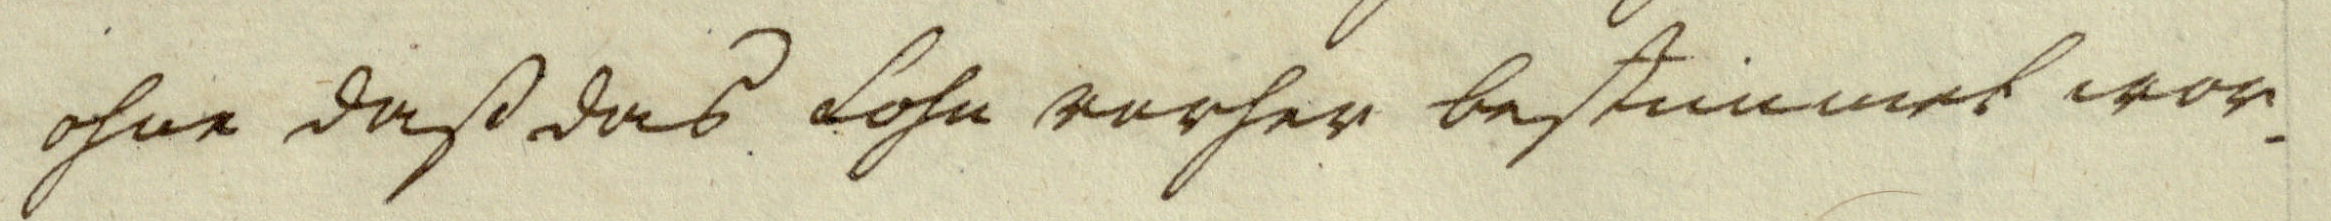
ohne daß das Lohn zuvor bestimmt wor¬
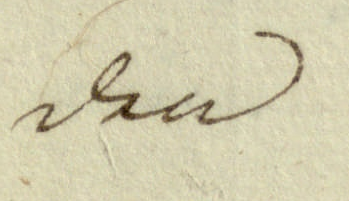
den
